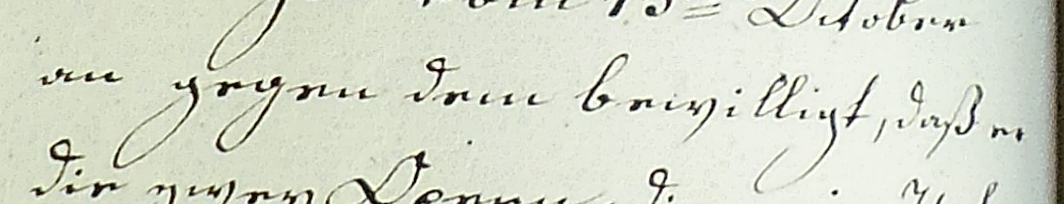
an gegen dem bewilligt, daß er
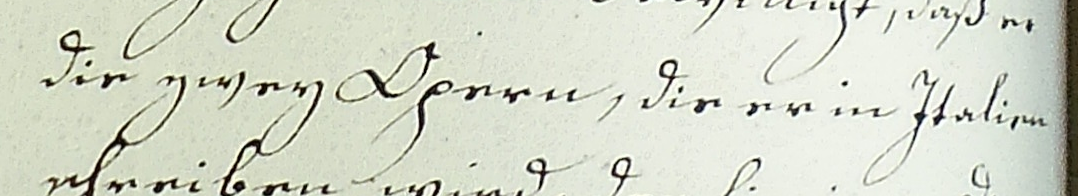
die zwey Opern, die er in Italien
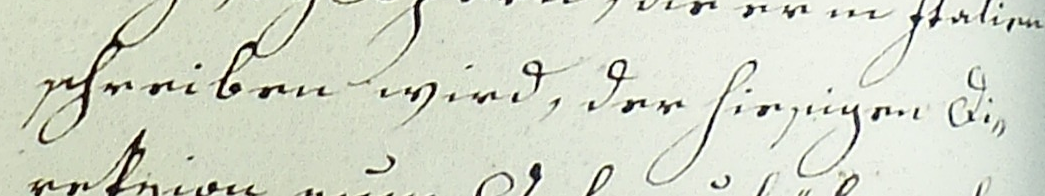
schreiben wird, der hiesigen Di¬
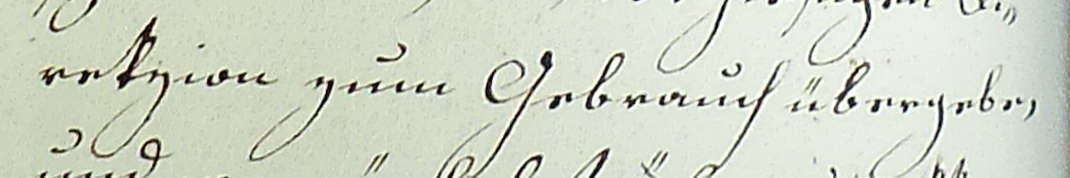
rekzion zum Gebrauch übergebe,
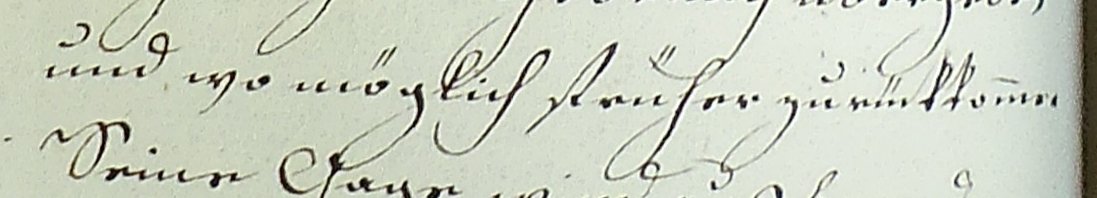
und wo möglich früher zurückkom̅e.
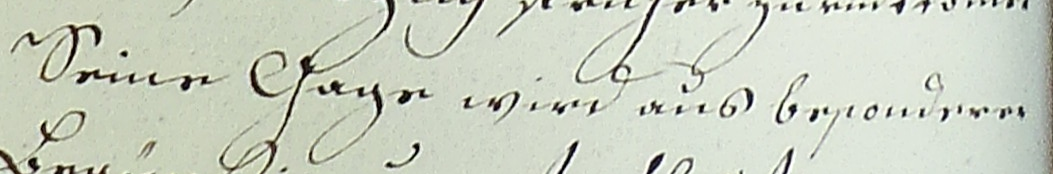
Seine Gage wird aus besonderer
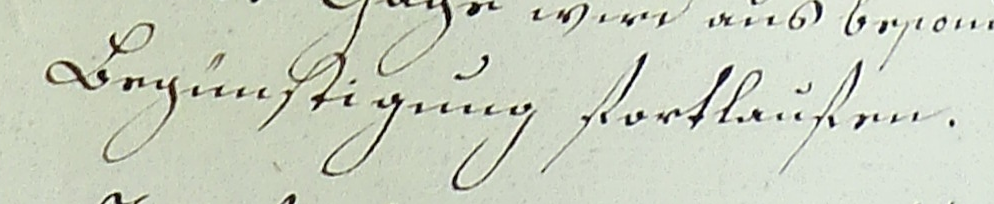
Begünstigung fortlaufen.
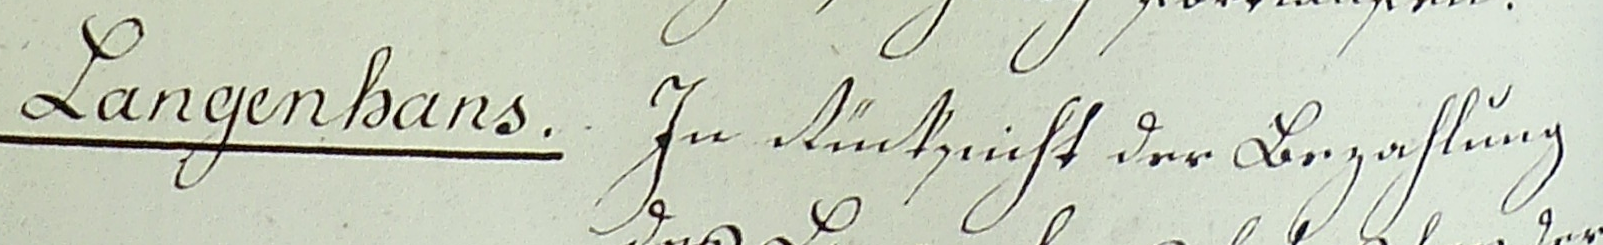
Langenhans. In Rücksicht der Bezahlung
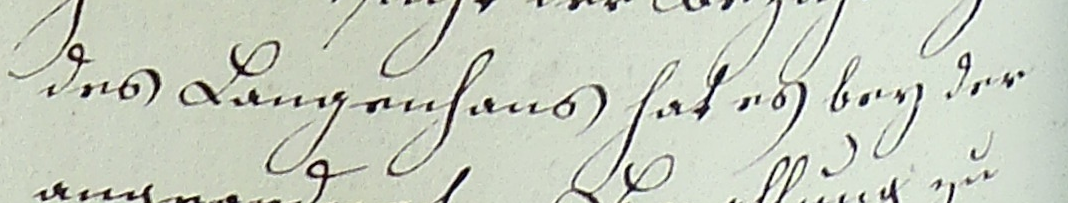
des Langenhans hat es bey der
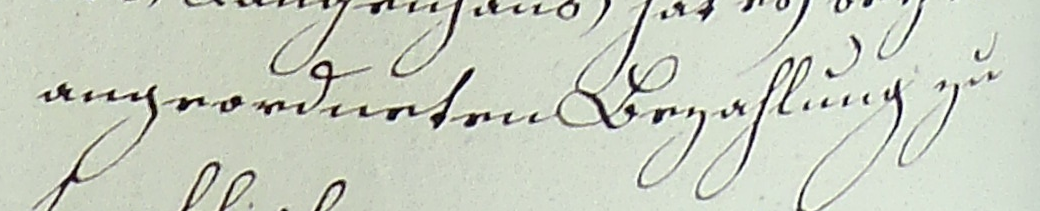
angeordneten Bezahlung zu
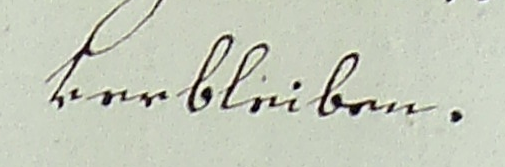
verbleiben.
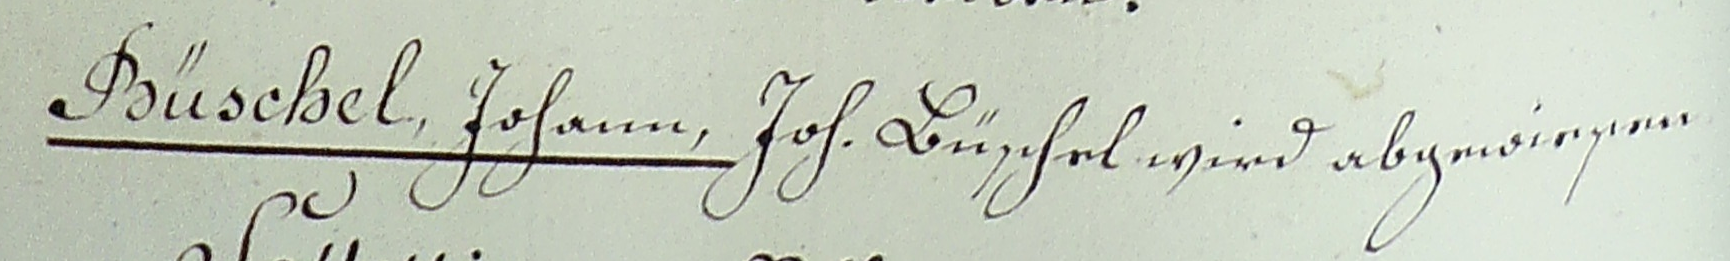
Büschel, Johann, Joh. Büschel wird abgewiesen.
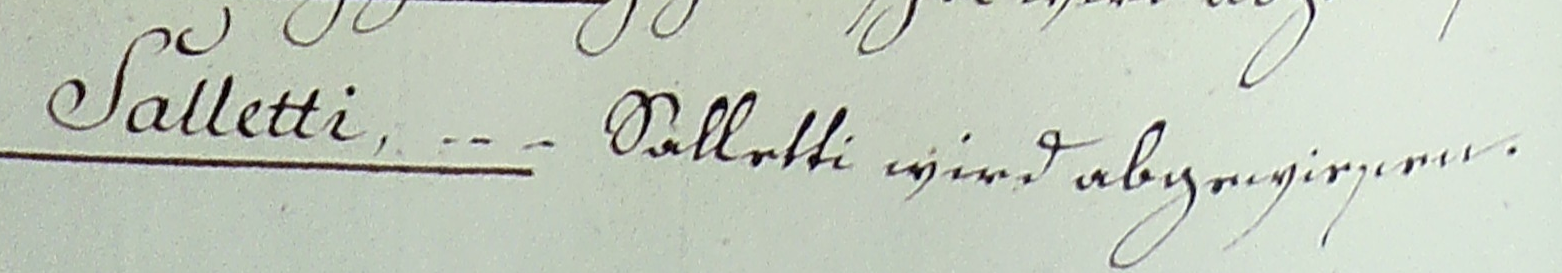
Salletti, . .. .. Salletti wird abgewiesen.
